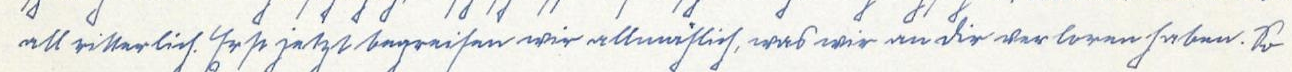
all ritterlich. Erst jetzt begreifen wir allmählich, was wir an dir verloren haben. So
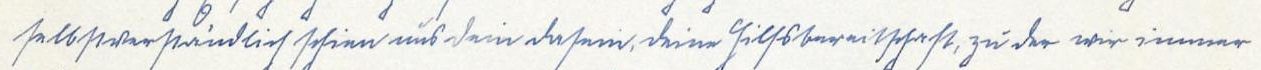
selbstverständlich schien uns dein Dasein, deine Hilfsbereitschaft, zu der wir immer
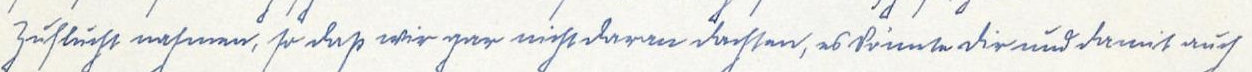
Zuflucht nehmen, so daß wir gar nicht daran dachten, es könnte dir und damit auch
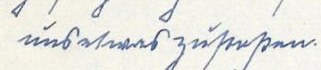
uns etwas zustoßen.
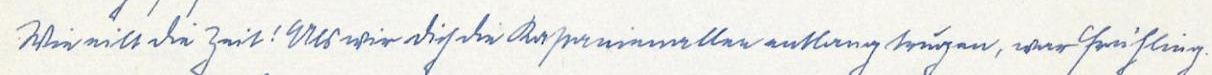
Wie eilt die Zeit! Als wir dich die Kastanienallee entlang trugen, war Frühling.
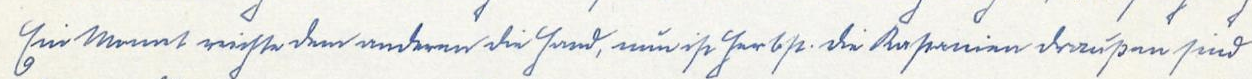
Ein Monat reichte dem anderen die Hand, nun ist Herbst. Die Kastanien draußen sind
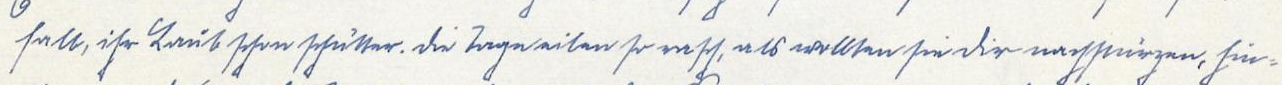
falb, ihr Laub schon schütter. Die Tage eilen so rasch, als wollten sie dir nachstürzen, hi-
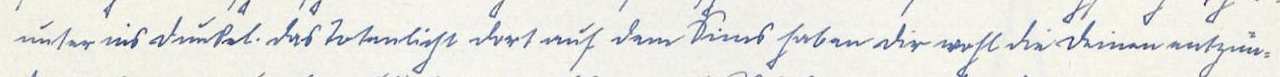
nunter ins Dunkel. Das Totenlicht auf dem Sims haben dir wohl die deinen entzün-
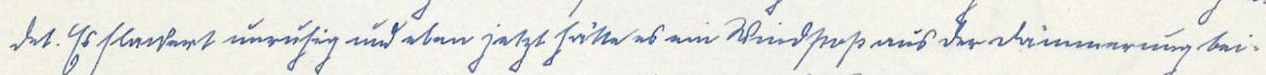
det. Es flackert unruhig und eben jetzt hätte es ein Windstoß aus der Dämmerung bei-
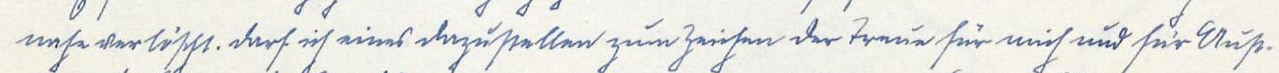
nahe verlöscht. Dass ich eines dazustellen zum Zeichen der Treue für mich und für Aust-
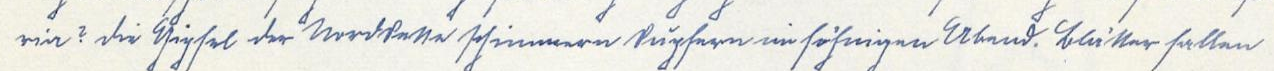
ria? Die Gipfel der Nordkette schimmern kupfern im föhnigen Abend. Blätter fallen
